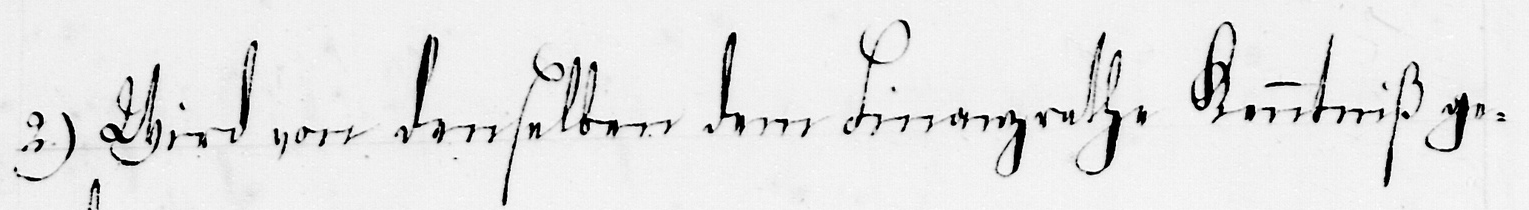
2.) Wird von denselben dem Finanzrathe Kenntniß ge¬
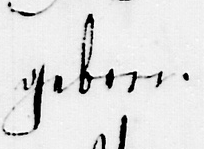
geben.
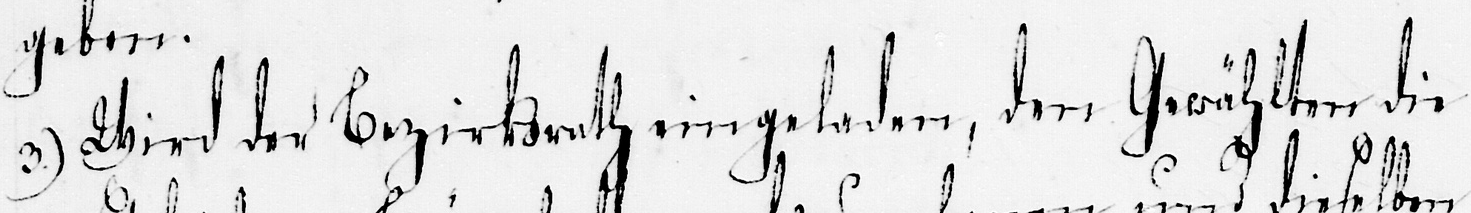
3.) Wird der Bezirksrath eingeladen, den Gewählten die
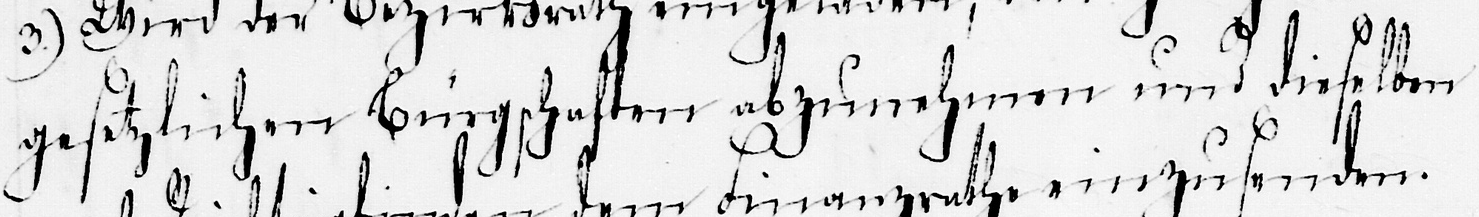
gesetzlichen Bürgschaften abzunehmen und dieselben
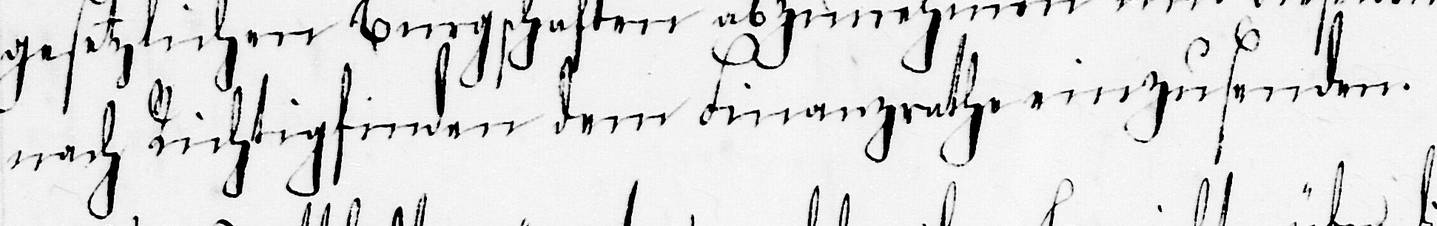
nach Richtigfinden dem Finanzrathe einzusenden.
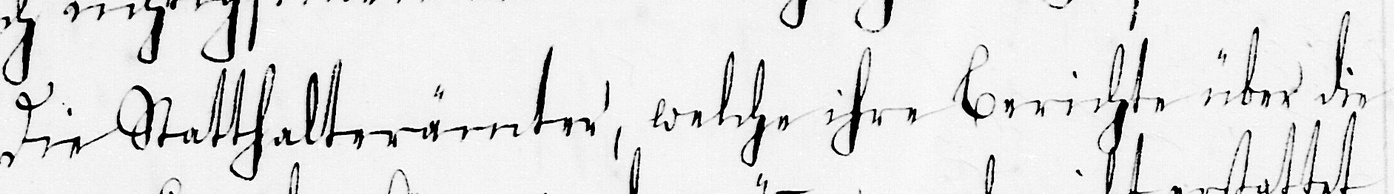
Die Statthalterämter, welche ihre Berichte über die
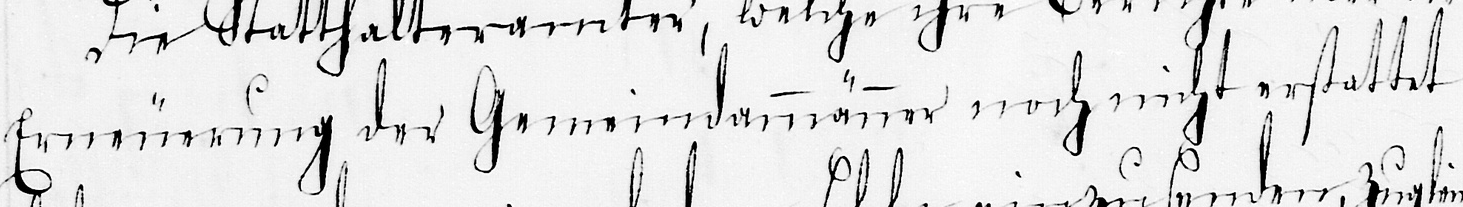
Erneuerung der Gemeindammänner noch nicht erstattet
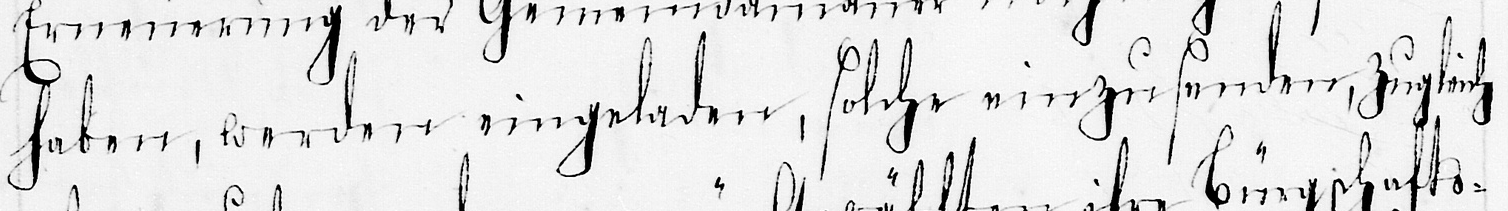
haben, werden eingeladen, solche einzusenden, zugleich
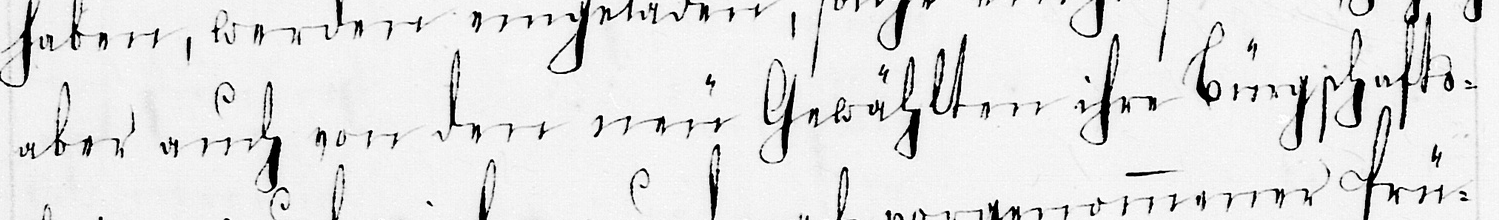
aber auch von den neu Gewählten ihre Bürgschafts¬
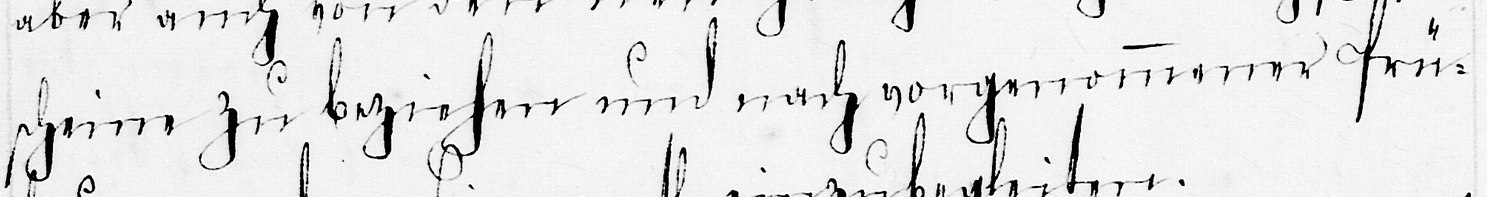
scheine zu beziehen und nach vorgenommener Prü¬
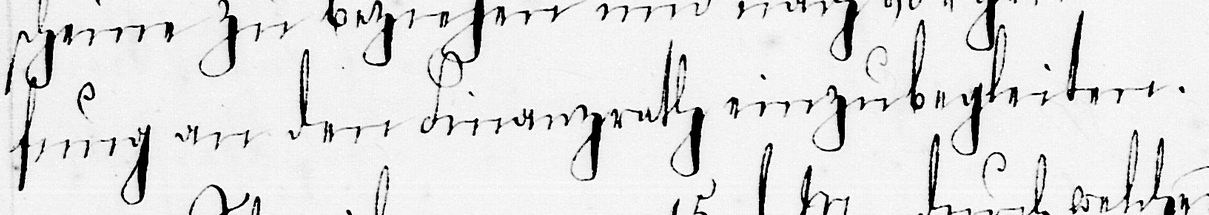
fung an den Finanzrath einzubegleiten.
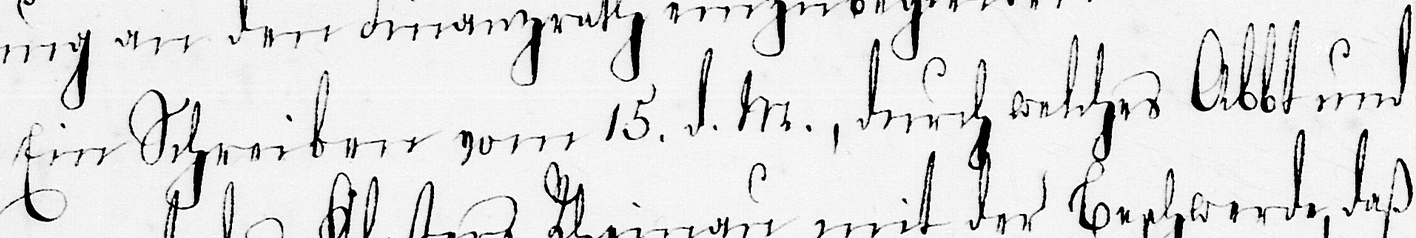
Ein Schreiben vom 15. d. M., durch welches Abbt und
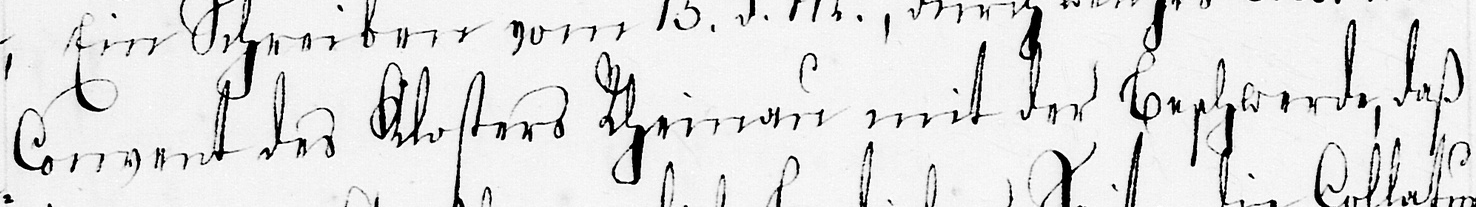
Convent des Klosters Rheinau mit der Beschwerde, daß
